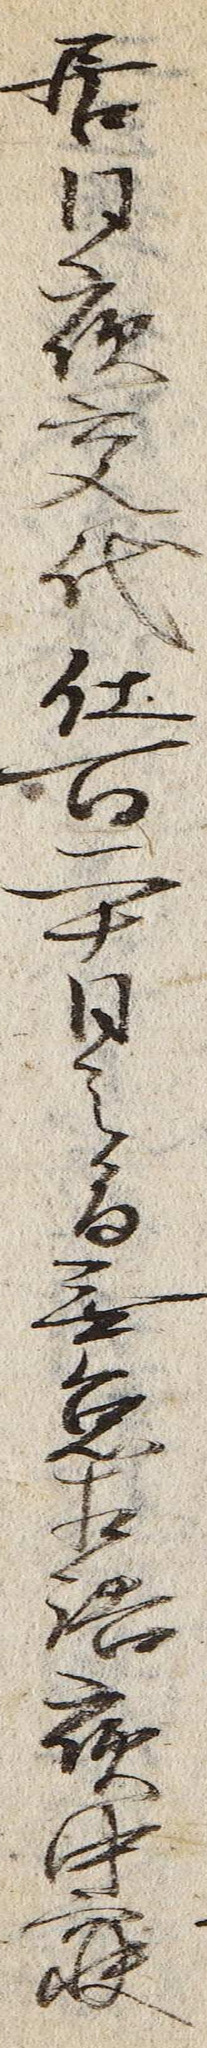居同夜交代仕百二十日の間無怠相詰夜中寝
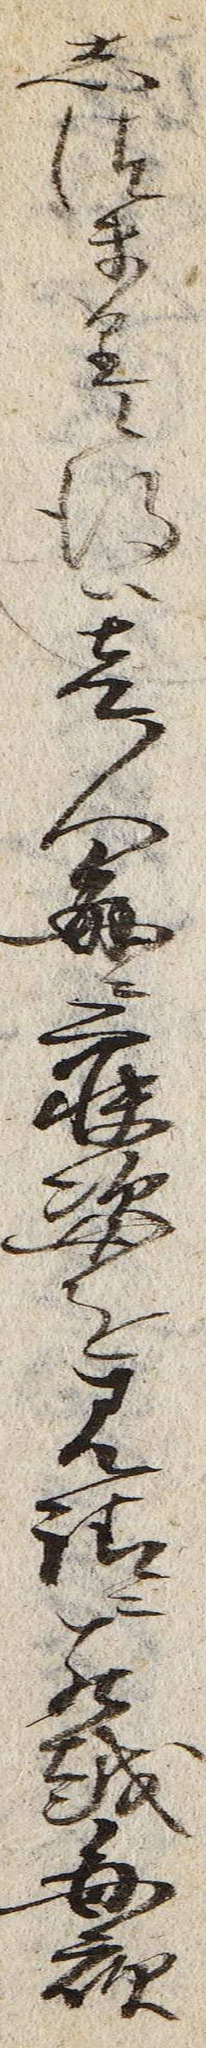しつまり候得は一人毎に寝姿を見請に罷越毎夜
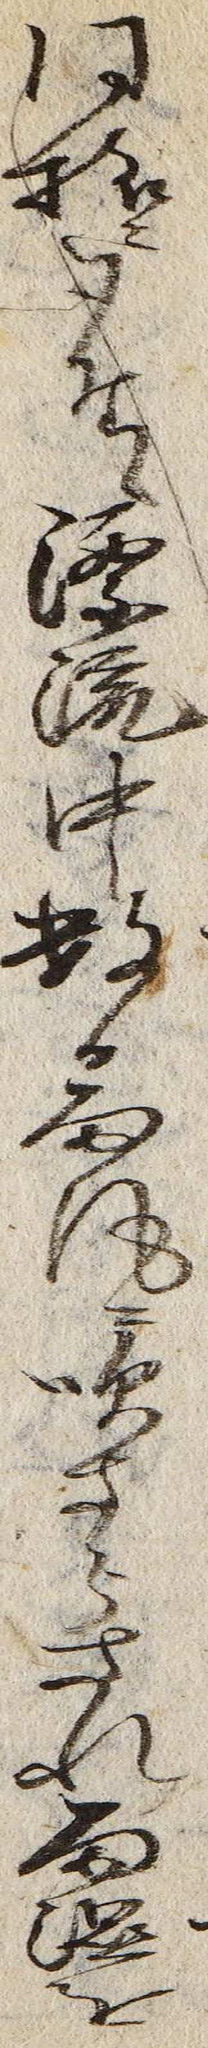同様に御座候漂流中数日雨風に吹さらされ雨湿を
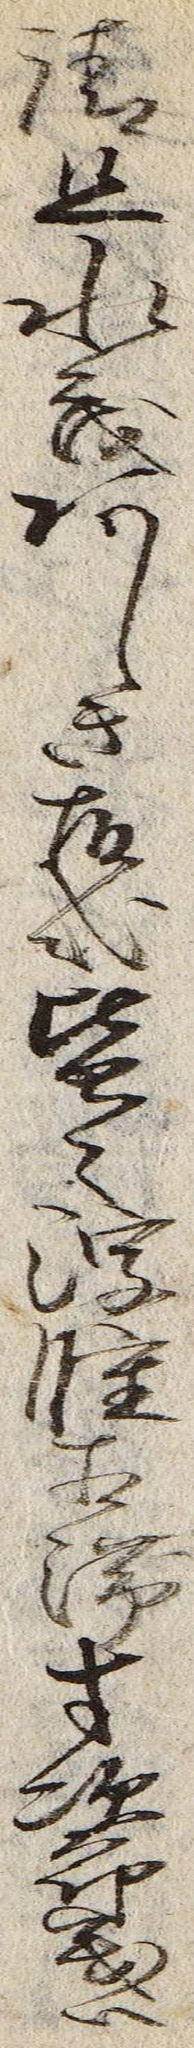請且水もあしき故哉皆々浮腫相滞筋義は
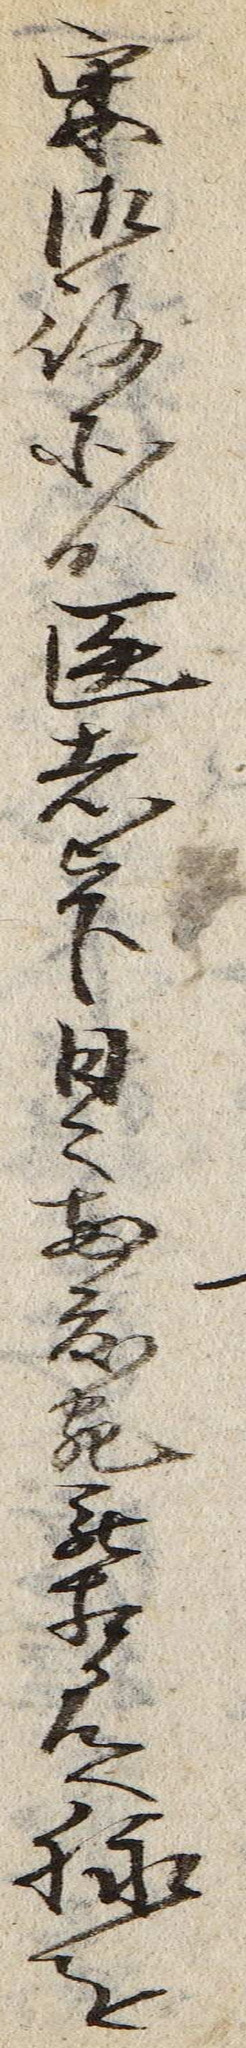宋御役所より医者被下日々両度罷相見へ脈を
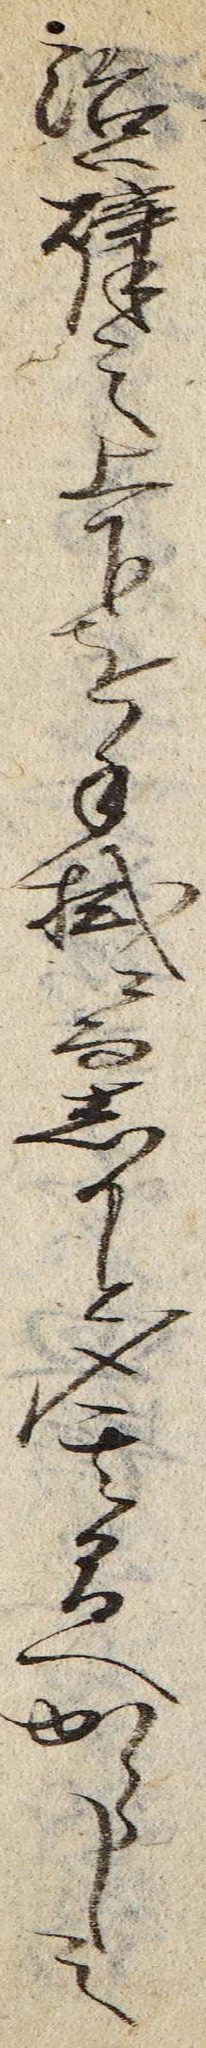治は臂の上下を手拭にてしかとしめ其間へからしの

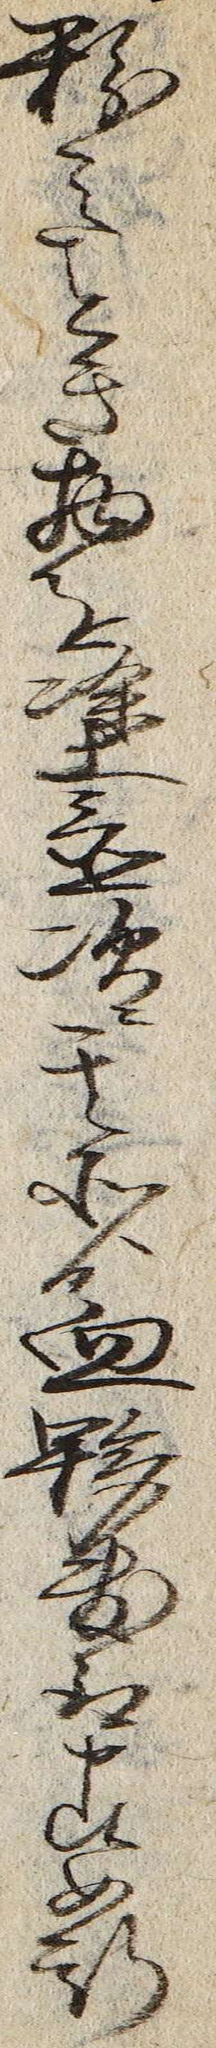粉のことき物を塗置次に其所より血夥しく取申候如斯
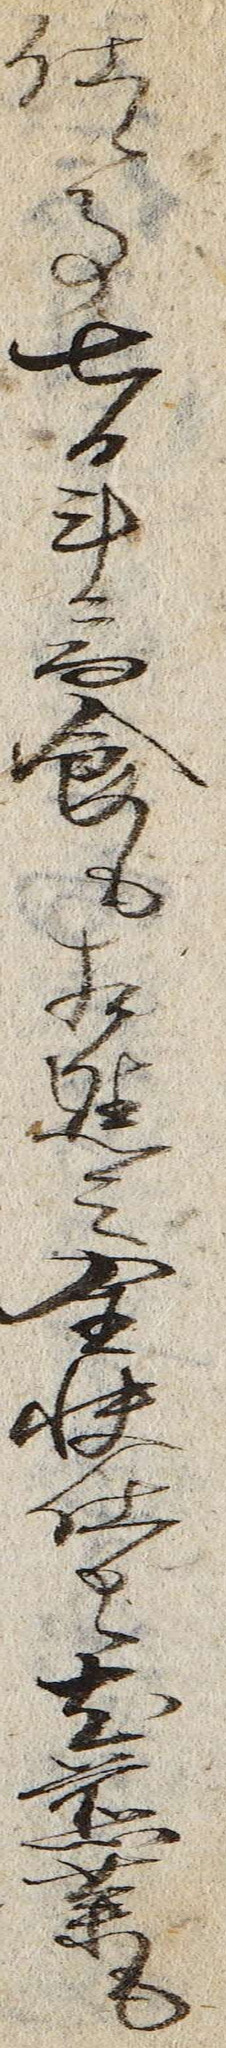仕候事七日斗にて食も相進み全快仕申候尤煎薬も
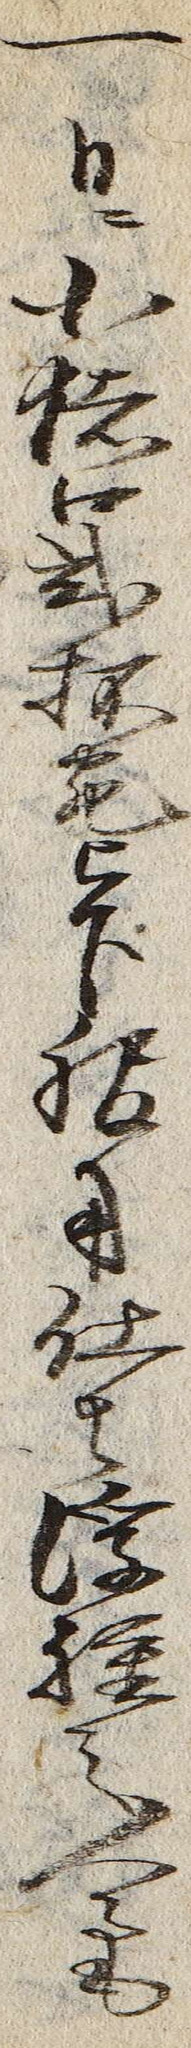一日に小猪口二杯ずつ被下服用仕申候浮腫の人にも
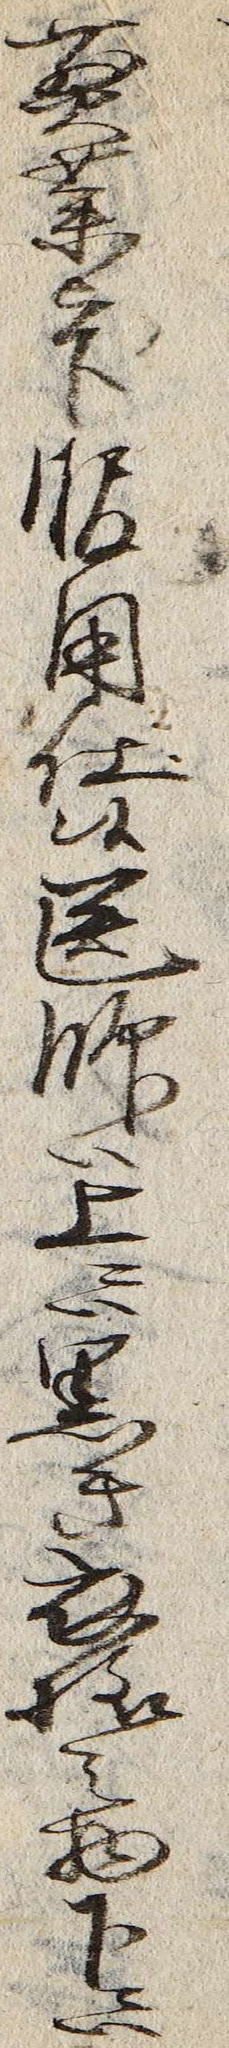煎薬被下服用仕候医師は上には黒き衣様の物下には
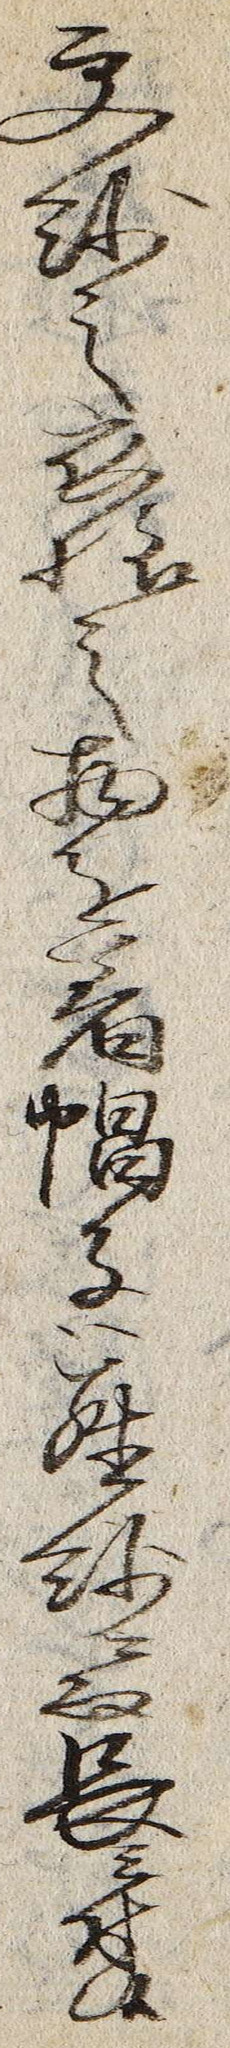更紗の衣様の物を着帽子は羅紗にて畏み付候
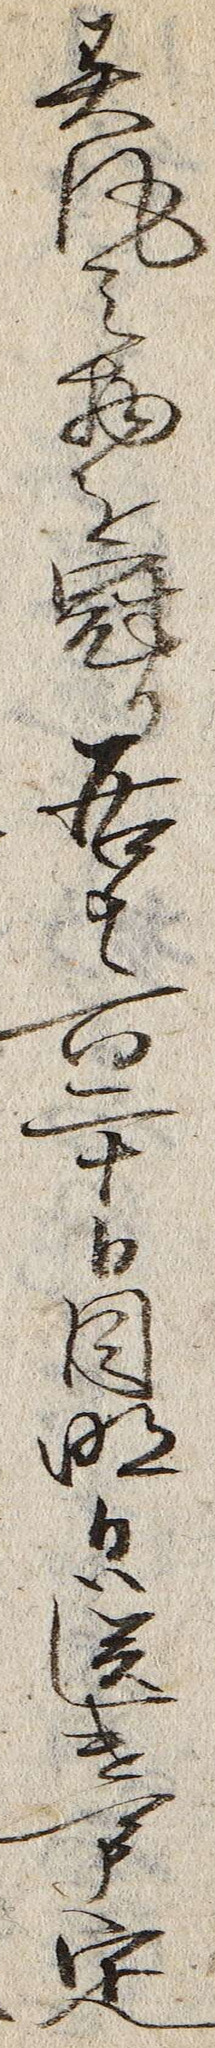異風の物を冠り居申候百二十日目明日は送遣可申定
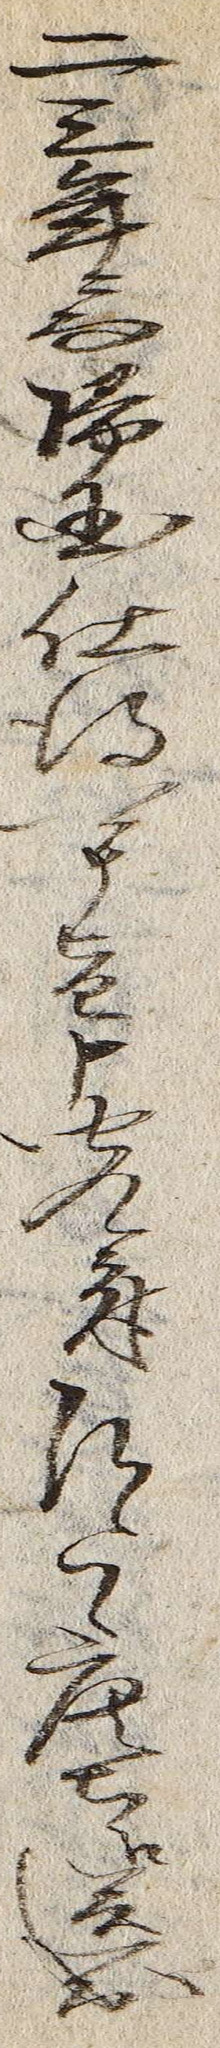ニ三年にて帰国仕得可申旨申聞に付左候はば唐土へ送出
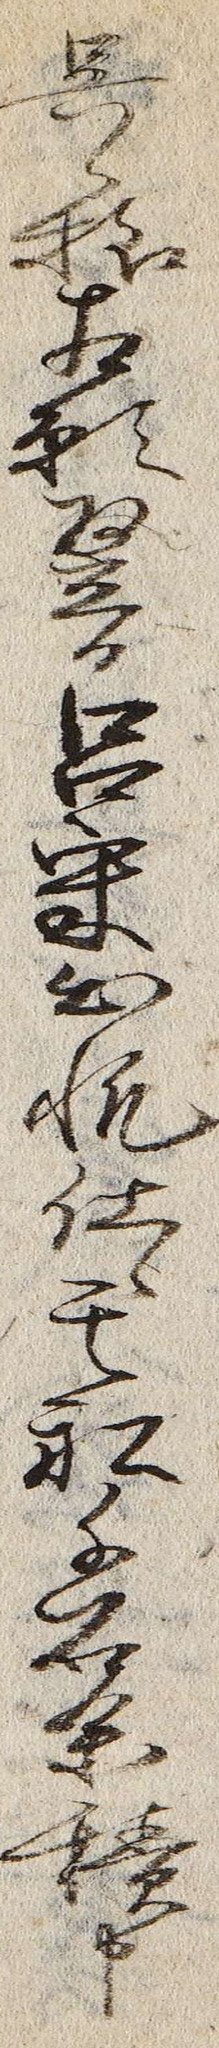呉候様相頼翌日呂宋出帆仕候其船千石余積申
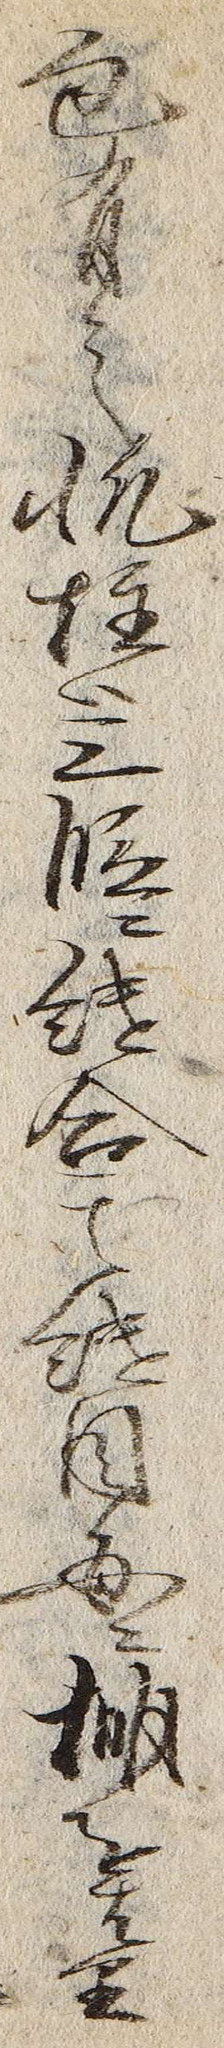包有之帆柱は三段に継合其継目毎に棚をはり
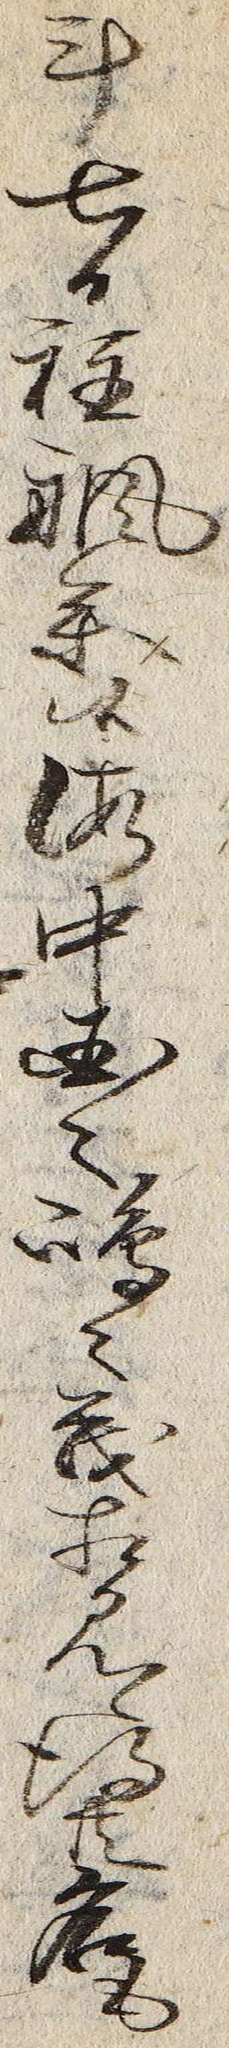斗七日程䑺参候海中国々島々も相見候得ども名も
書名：能登国清兵衛異国江漂流之始末
